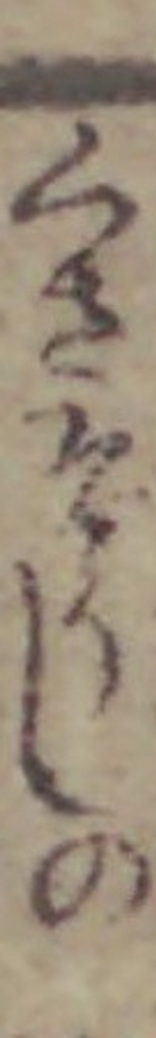くさぞうしの
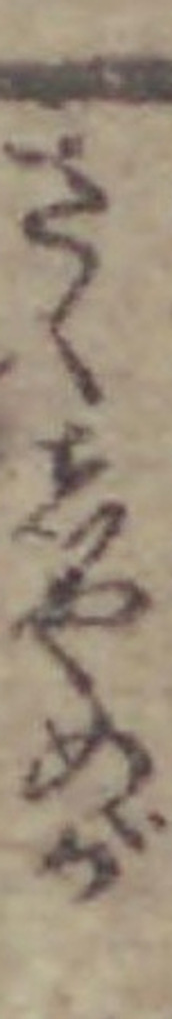さくしやめが
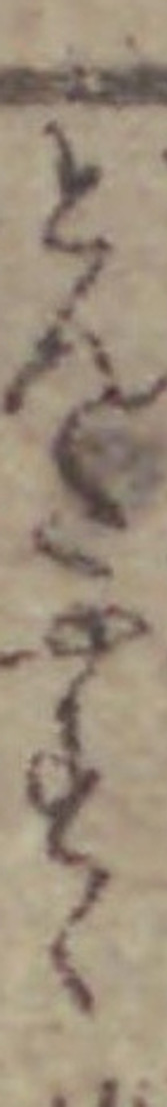とんたやすく
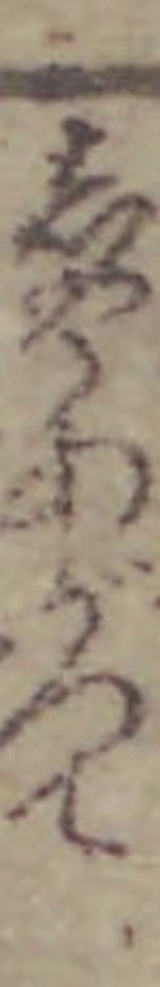しやあがつて
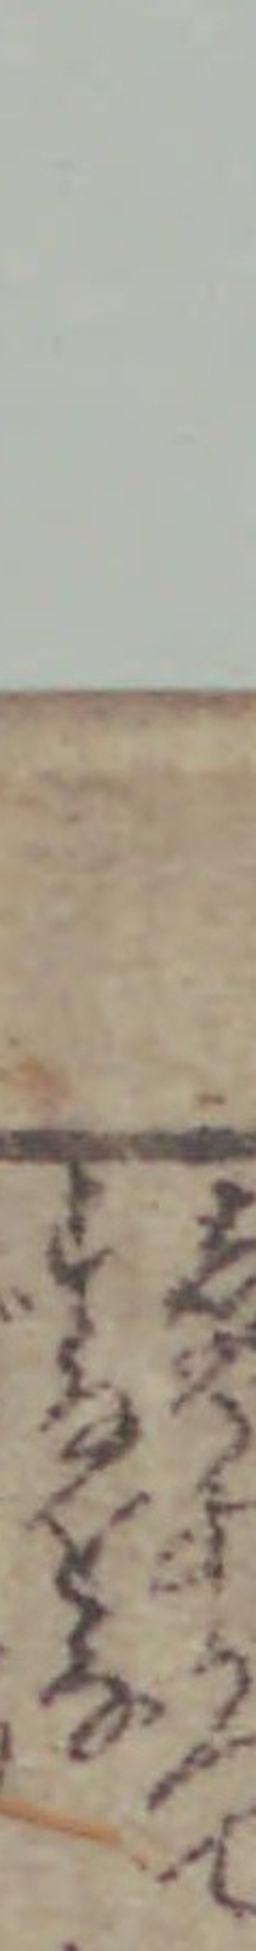すなをな
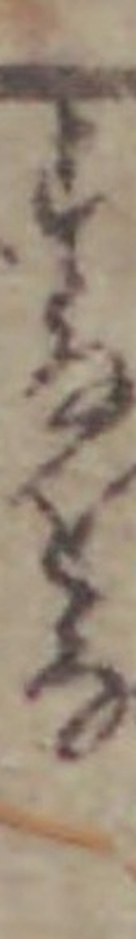すなをな
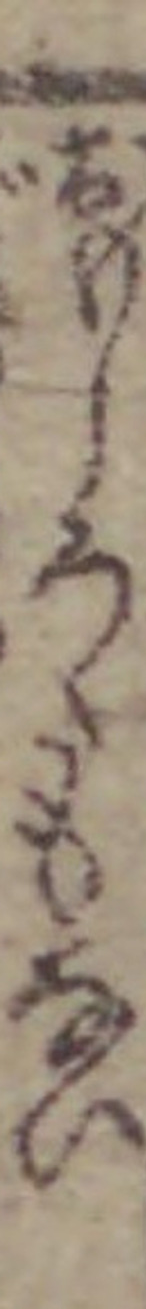おもしろくもない
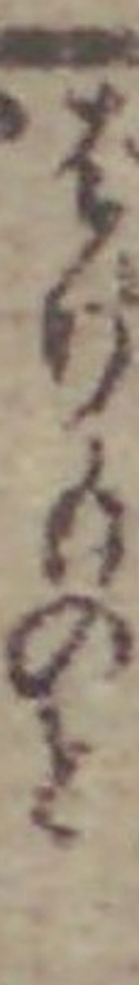ばけものと
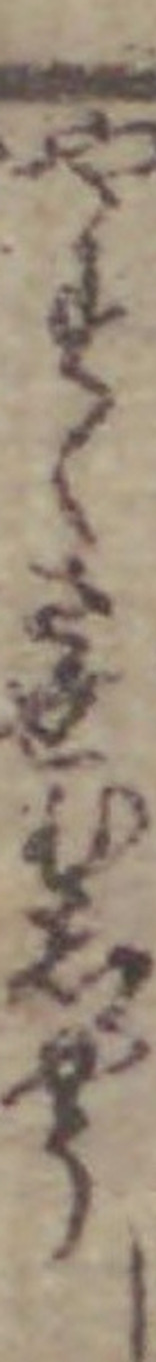やすくさせむしやう
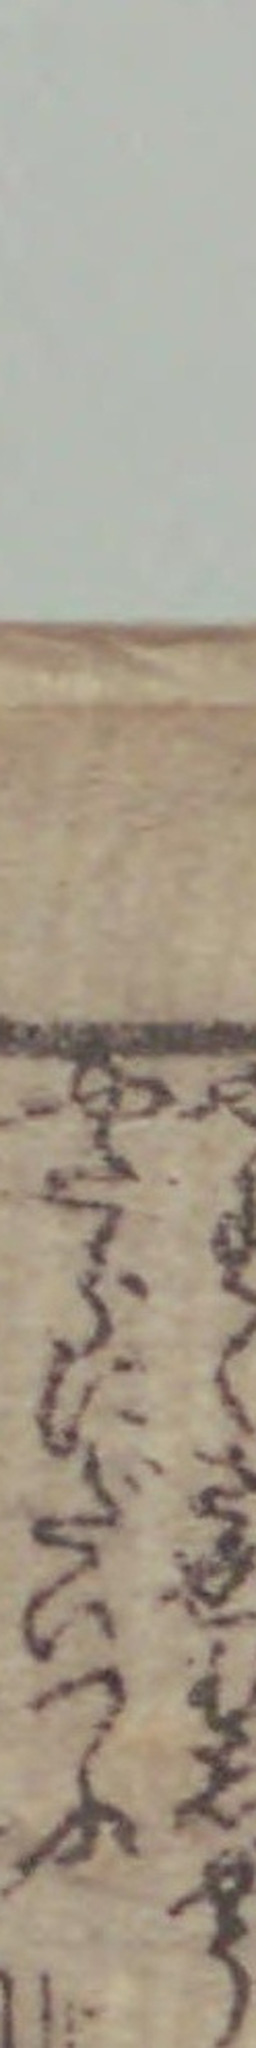やたらにだいつふ
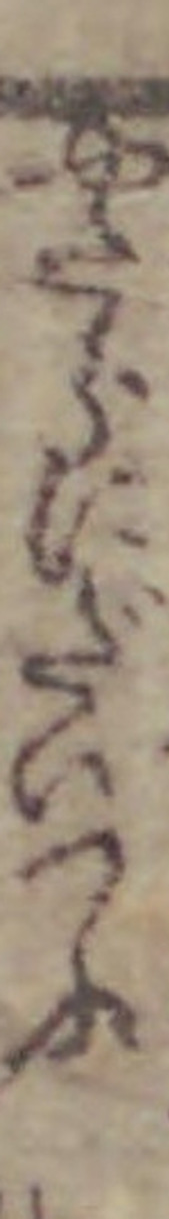やたらにだいつふ
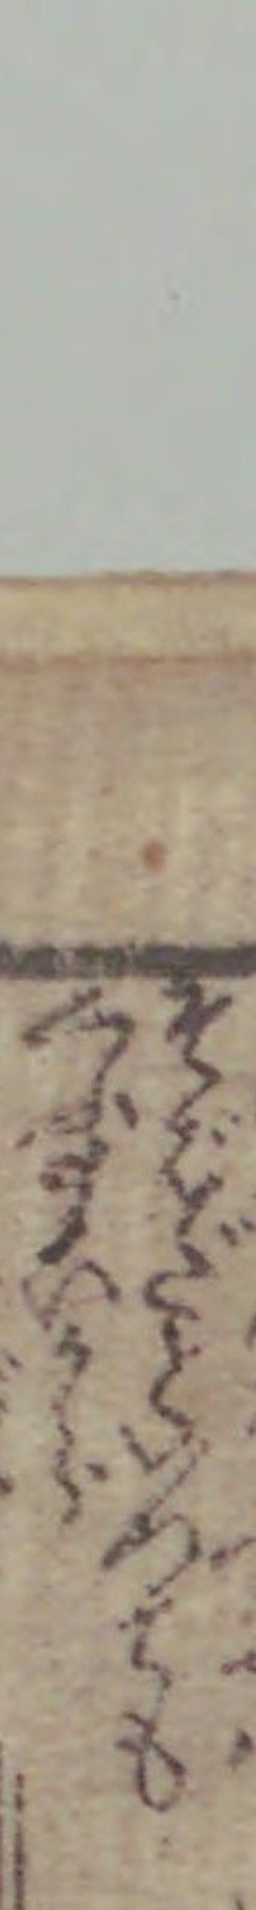くふまいから
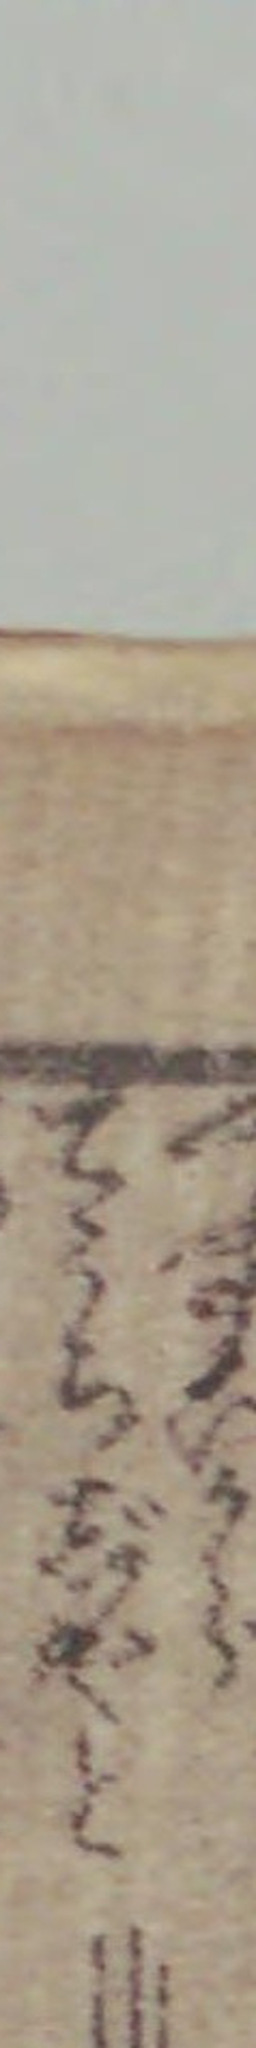てうちじやと
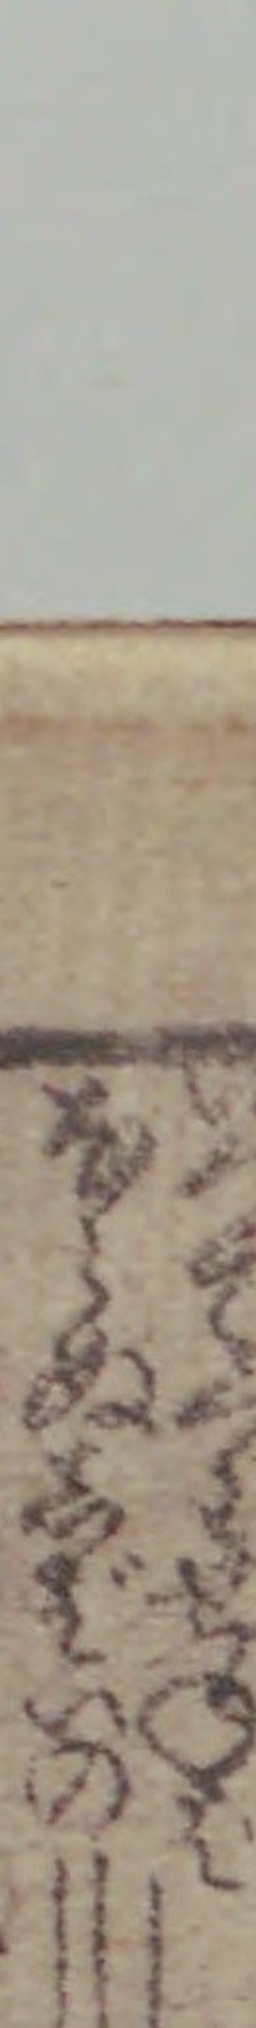ならぬしばいの
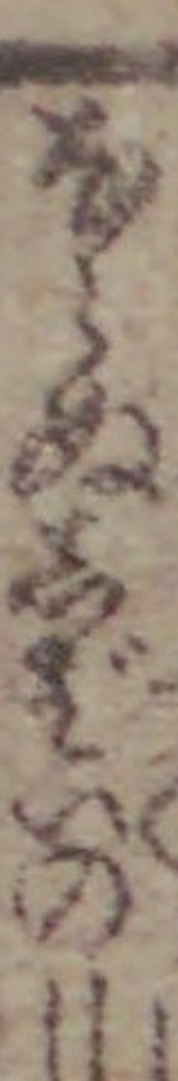ならぬしばいの
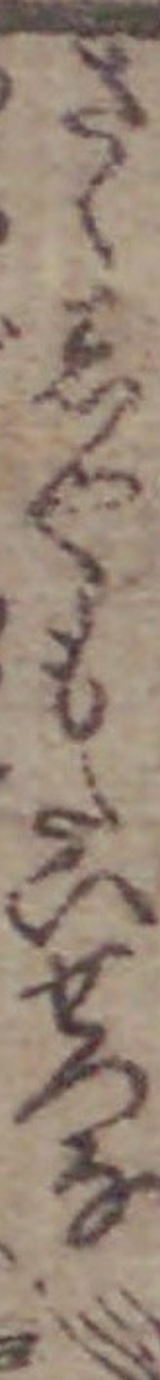さくしやもたいせつな
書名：化物鼻がひしげ 2巻
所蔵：国立国会図書館 National Diet Library, JAPAN
